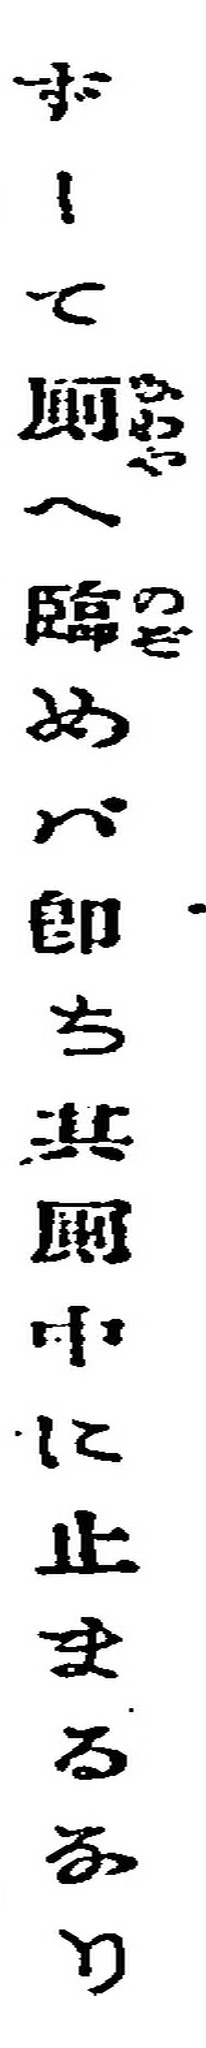ずして厠へ臨めば即ち其厠中に止まるなり
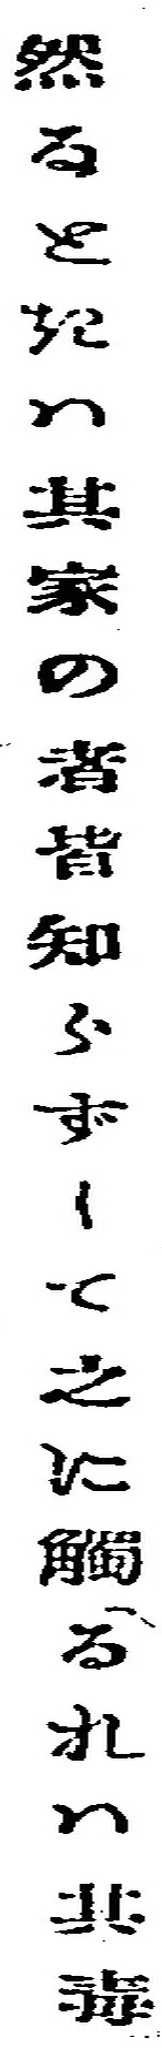然るときは其家の者皆知らずして之に触るれは其毒
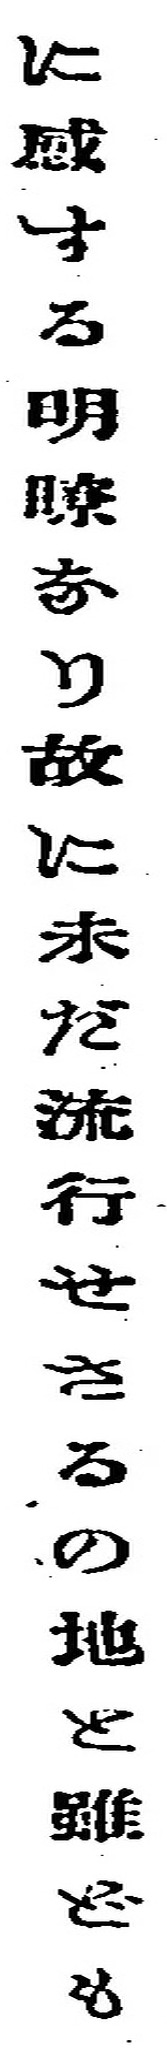に感する明瞭なり故に未だ流行せさるの地と雖ども
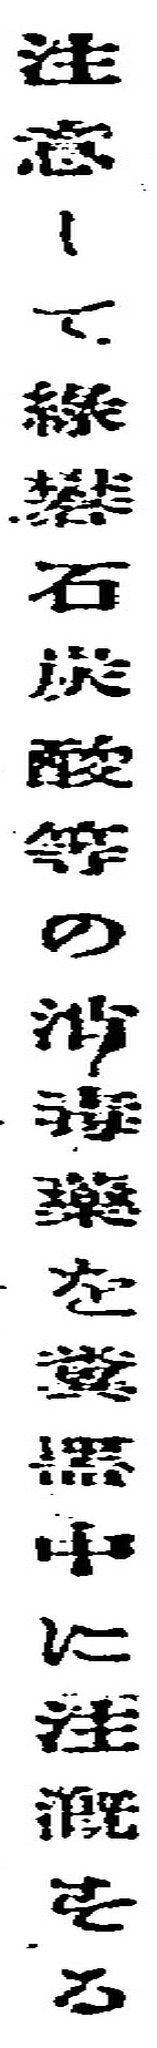注意して緑礬石炭酸等の消毒薬を糞器中に注漑する
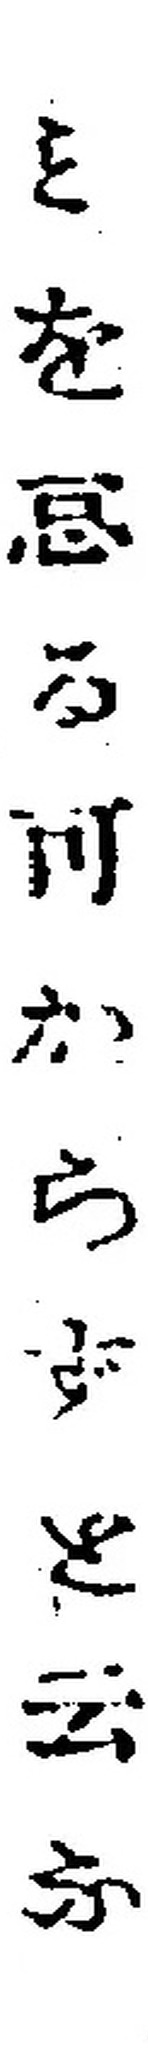ことを怠る可からずと云ふ
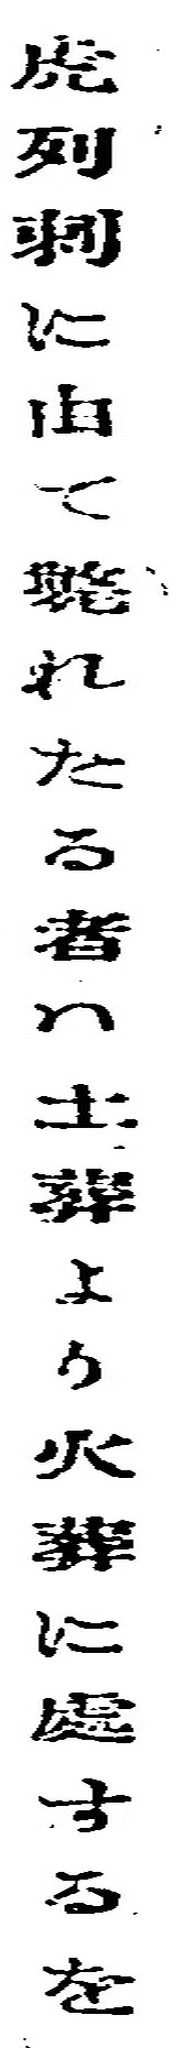虎列刺に由て斃れたる者は土葬より火葬に処するを
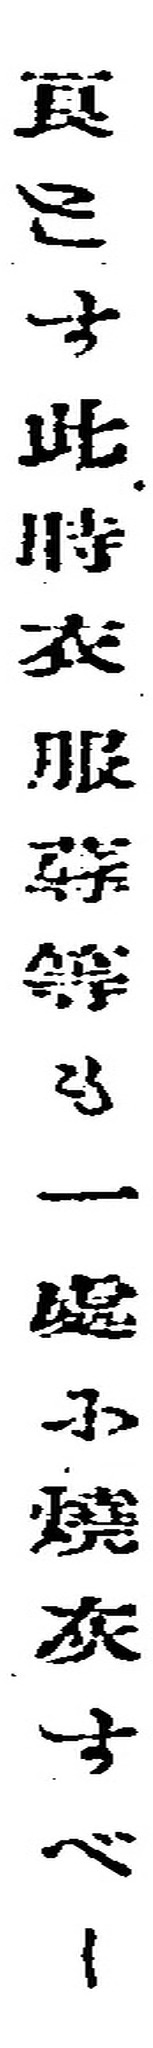良とす此時衣服蓐等も一処に焼灰すべし
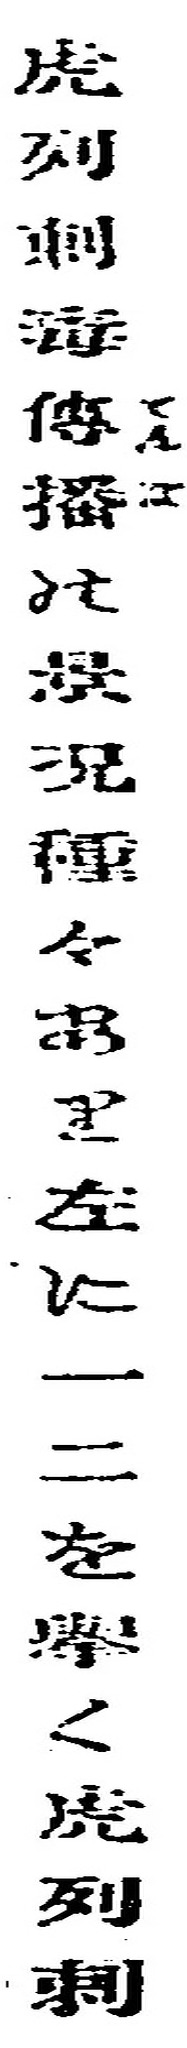虎列刺毒伝播の景況種々あり左に一二を挙く虎列刺
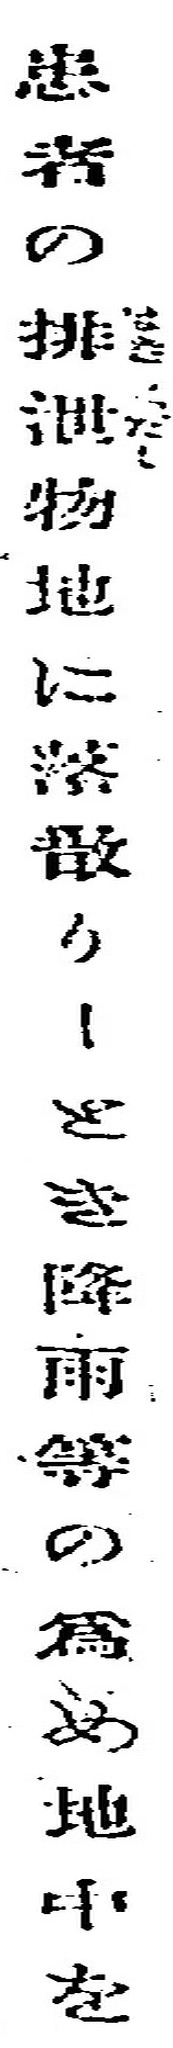患者の排泄物地に落散りしとき降雨等の為め地中を
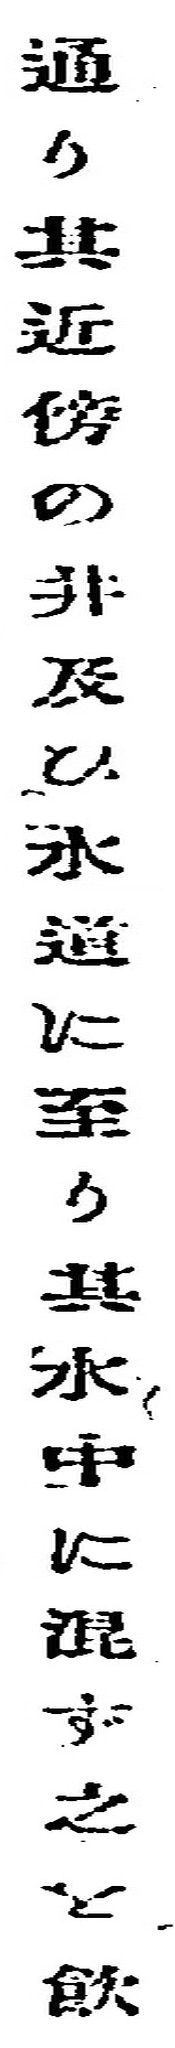通り其近傍の井及ひ水道に至り其水中に混ず之を飲
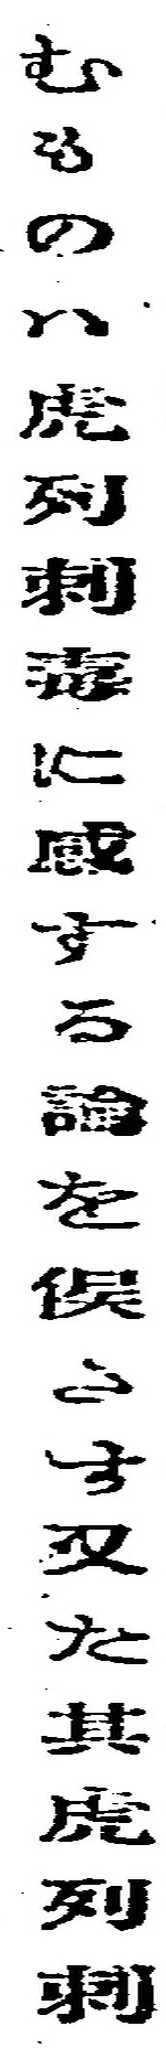むものは虎列刺毒に感する論を俣たす又た其虎列刺
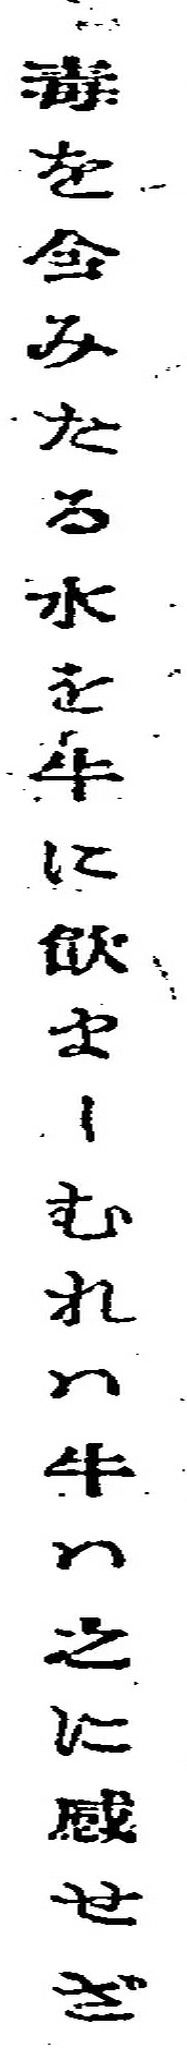毒を含みたる水を牛に飲ましむれは牛は之に感せざ
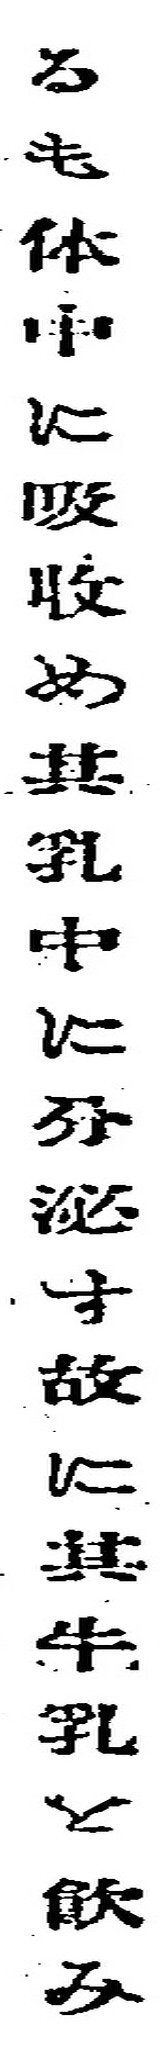るも体中に吸収め其乳中に分泌す故に其牛乳を飲み

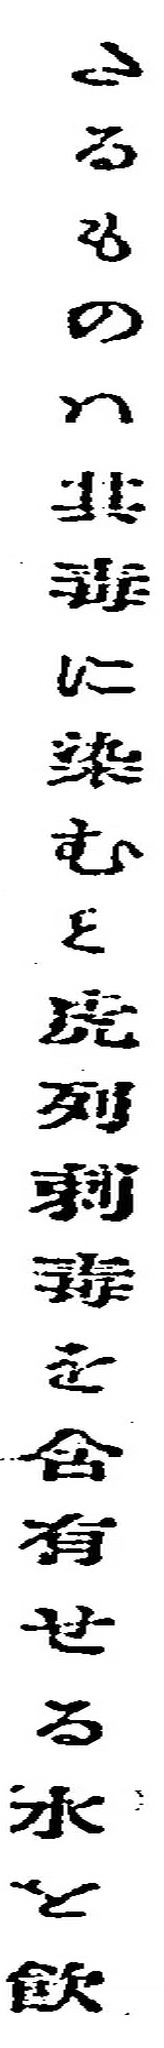たるものは其毒に染むと虎列刺毒を含有せる水を飲
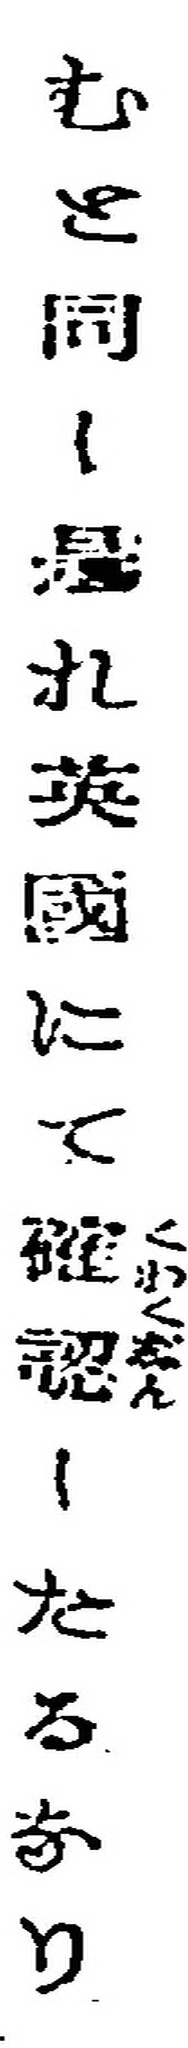むと同し是れ英国にて確認したるなり
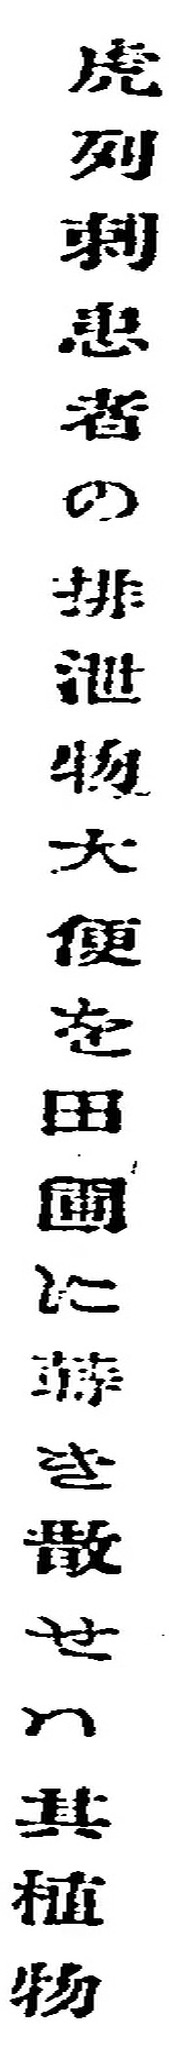虎列刺患者の排泄物大便を田圃に蒔き散せは其植物
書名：これら病予防心得
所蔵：国立国会図書館 National Diet Library, JAPAN
